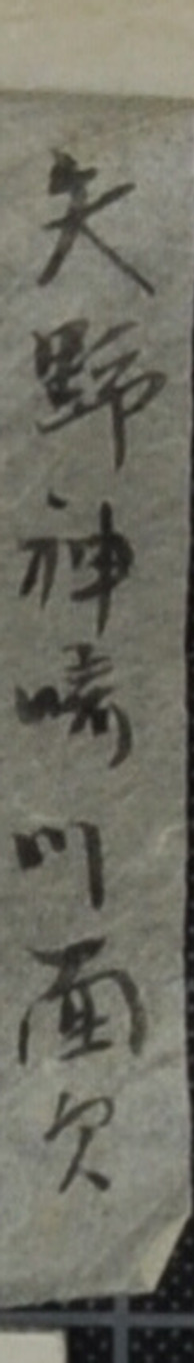矢野神崎川西欠

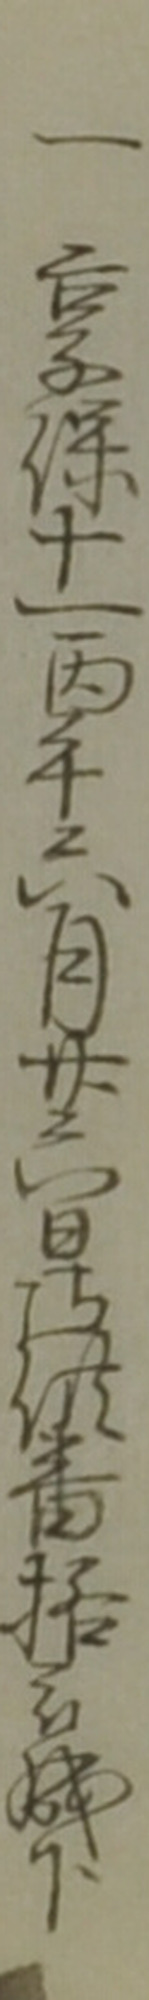一享保十一丙午六月廿六日御供番格被成下
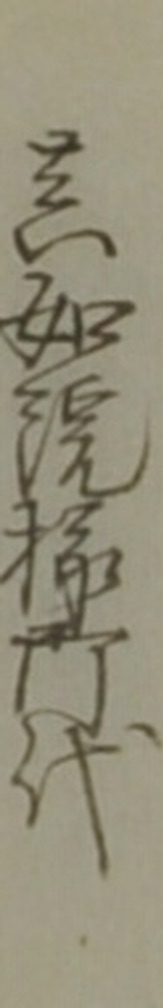真如院様御代
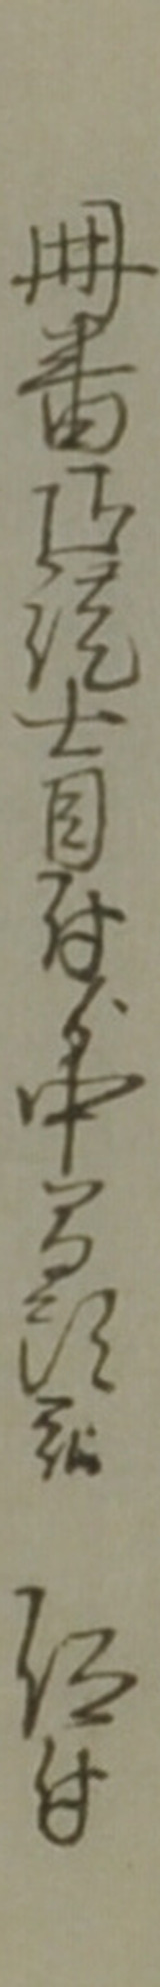用番御徒士目付ゟ中間頭被仰付
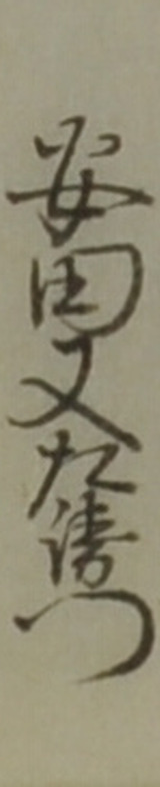安田又左衛門
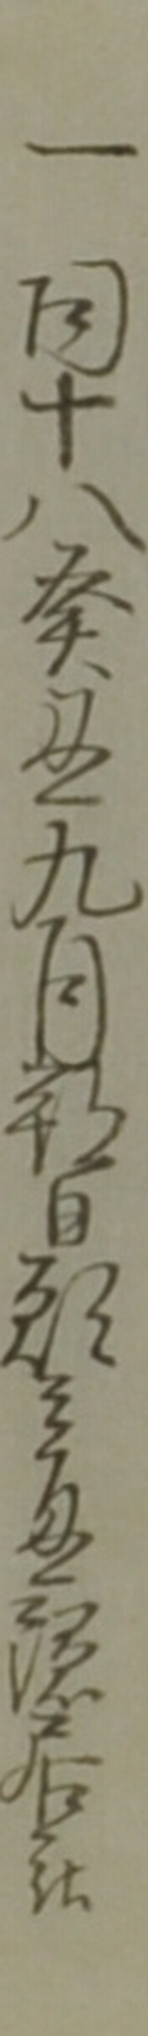一同十八癸丑九月朔日願之通隠居被
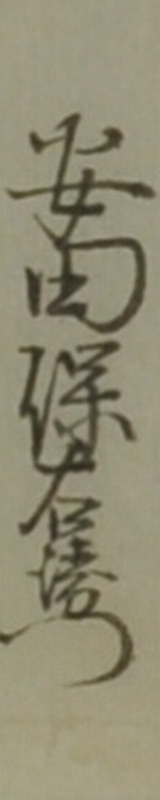安田保右衛門
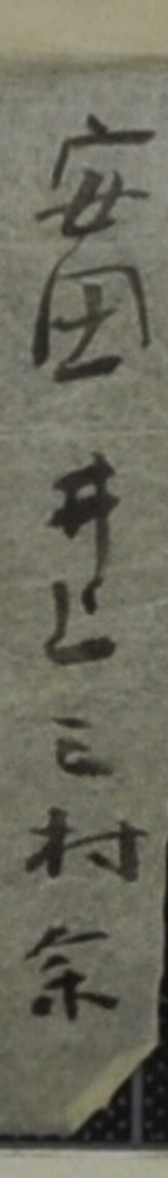安田井上三村余
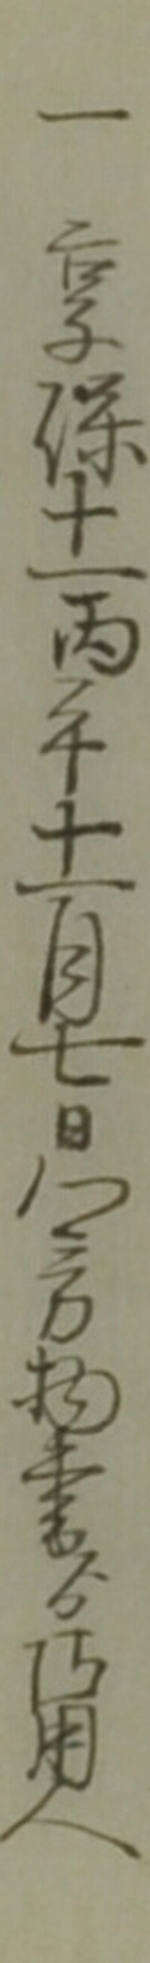一享保十一丙午十一月七日郷方物書ゟ御用人
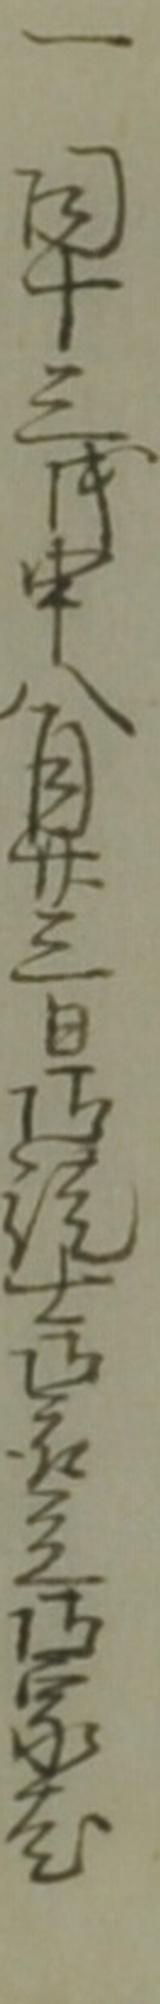一同十三戊申八月廿三日御徒士御取立御家老
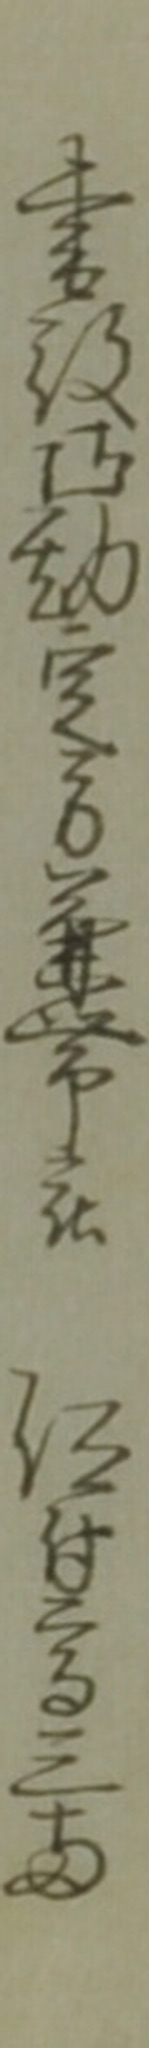書役御勘定方兼帯被仰付高三両
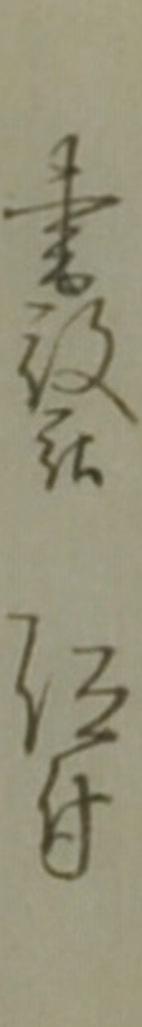書役被仰付
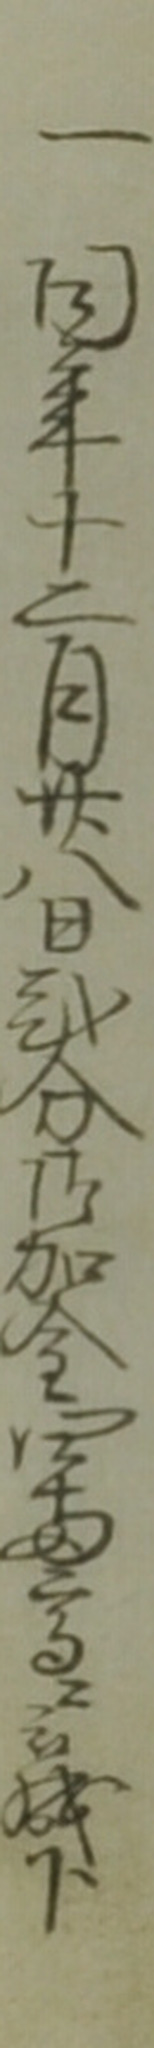一同年十二月廿八日弐分御加金四両高ニ被成下
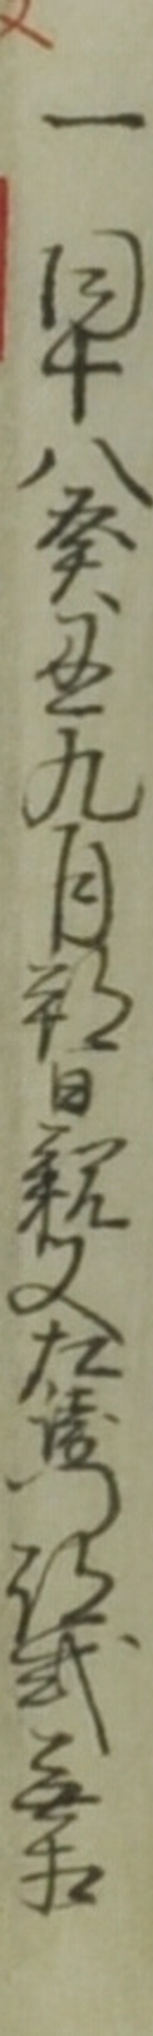一同十八癸丑九月朔日親又左衛門跡式無相
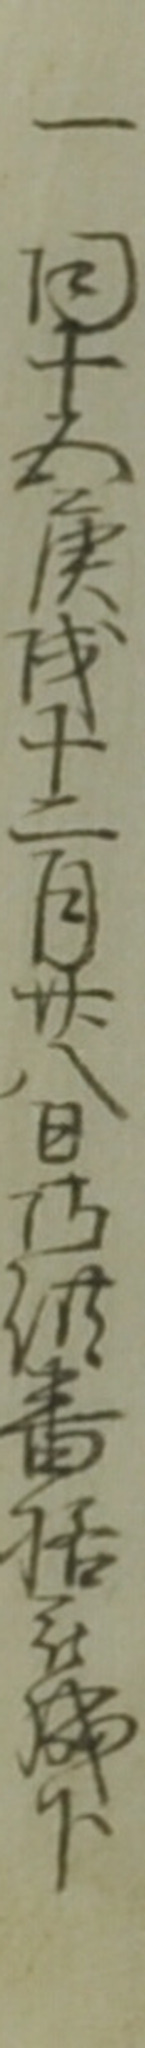一同十五庚戌十二月廿八日御供番格被成下

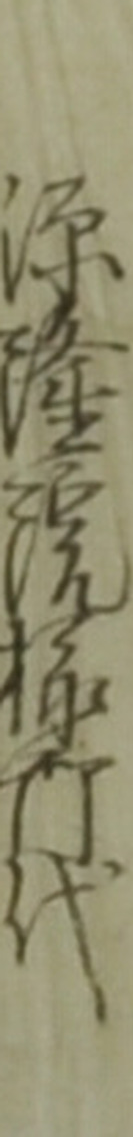源隆院様御代
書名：無足諸士勤仕録（一）
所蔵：伊那市立高遠町図書館・合同会社AMANE
